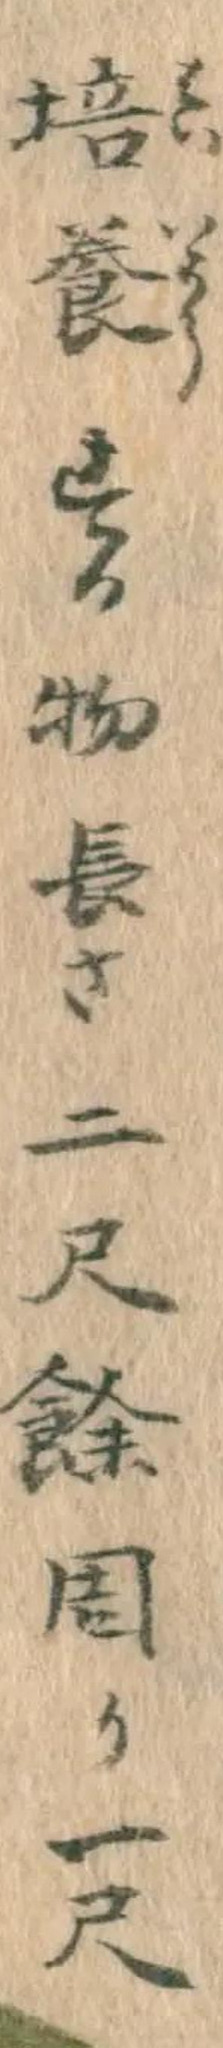培養する物長さ二尺余周り一尺
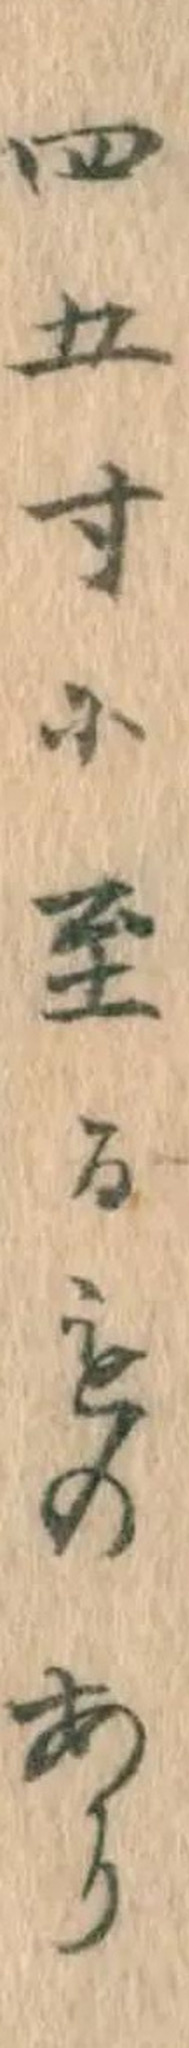四五寸に至るものあり

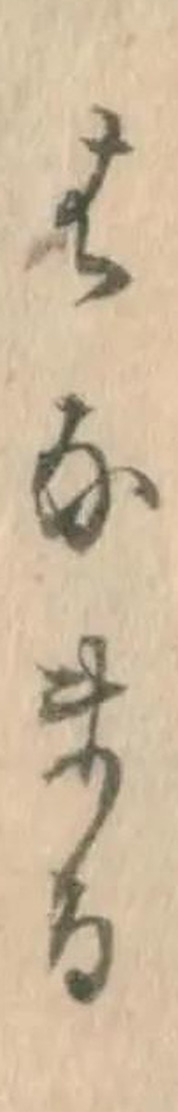はなまる
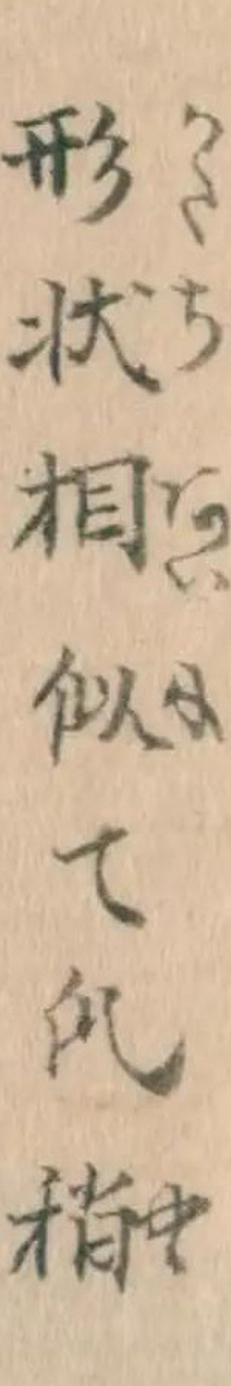形状相似て瓜稍
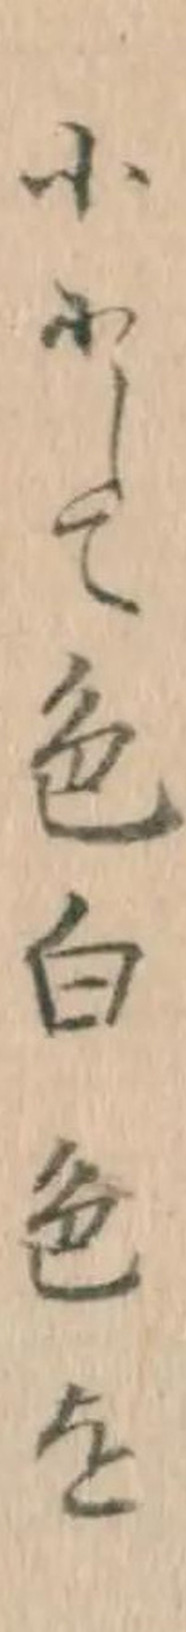小にして色白色を
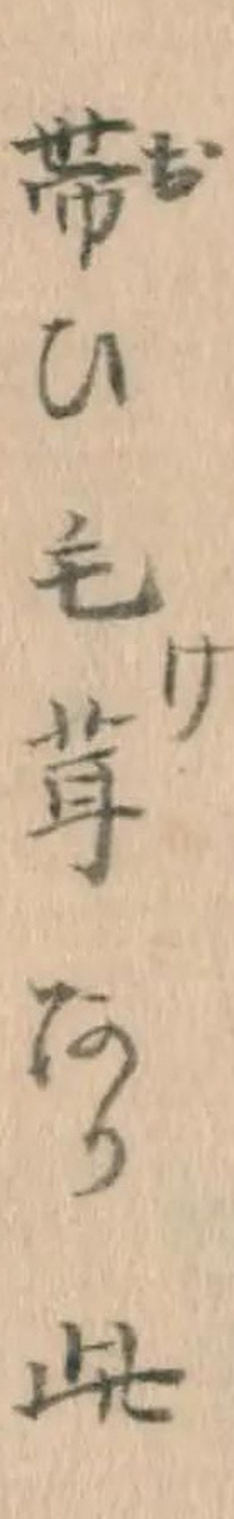帯ひ毛茸あり此
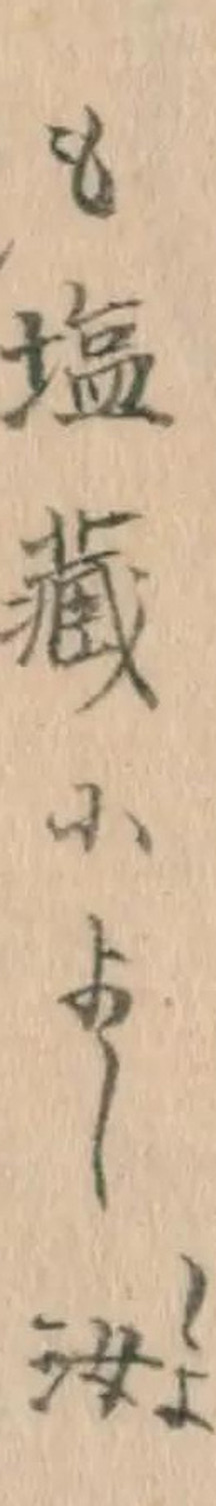も塩蔵によし汝
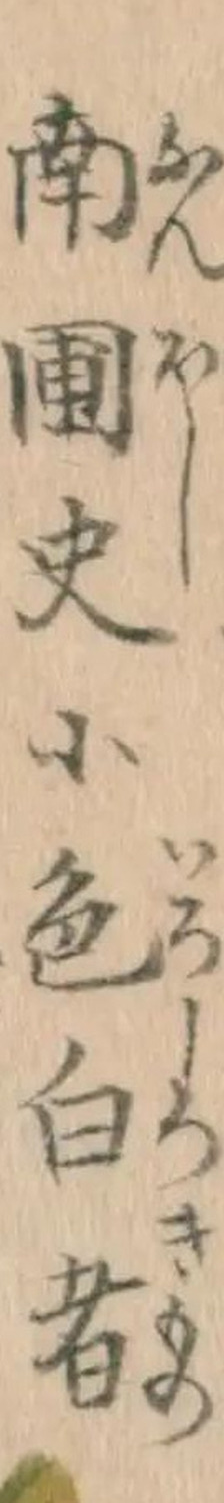南圃史に色白者
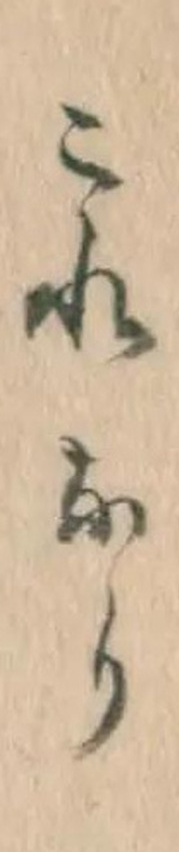これなり

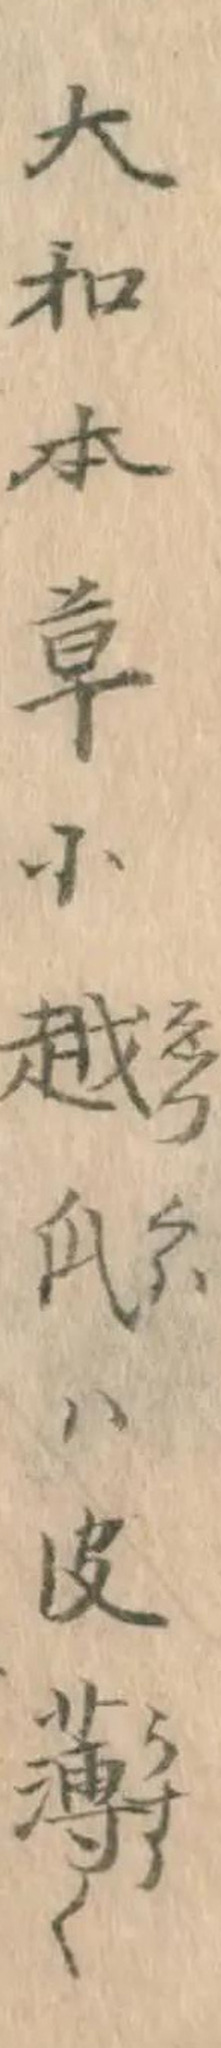大和本草に越瓜は皮薄く
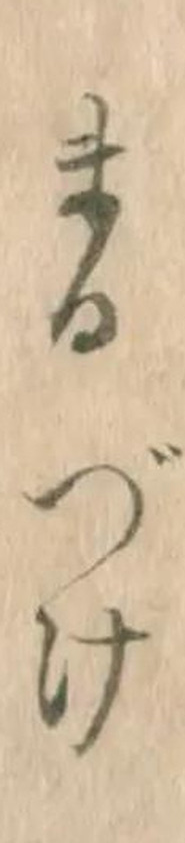まるづけ
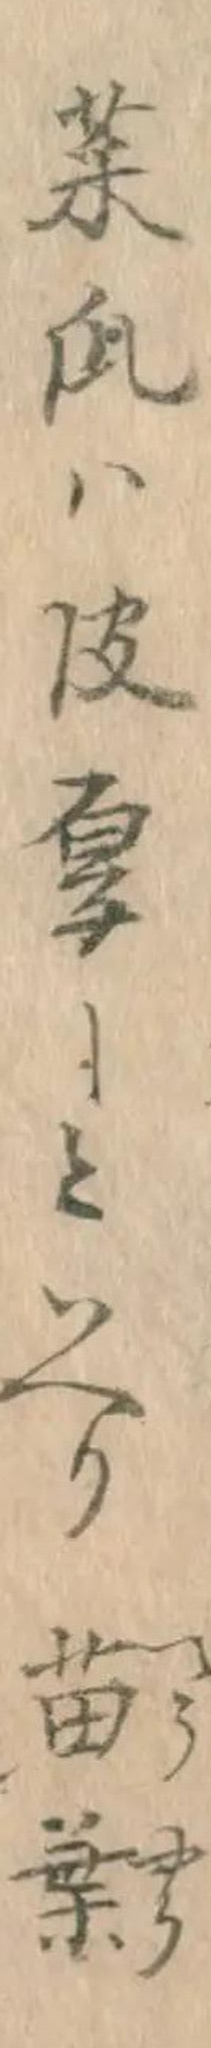菜瓜は皮厚しといへり苗葉
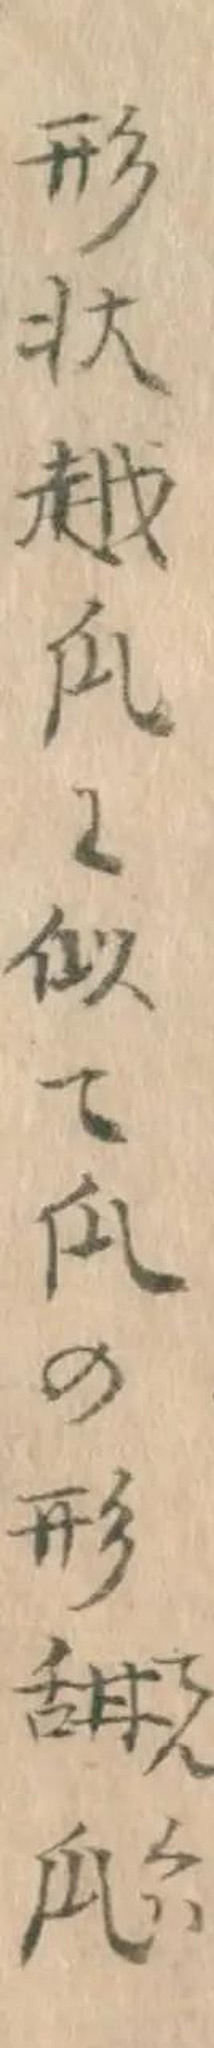形状越瓜に似て瓜の形甜瓜
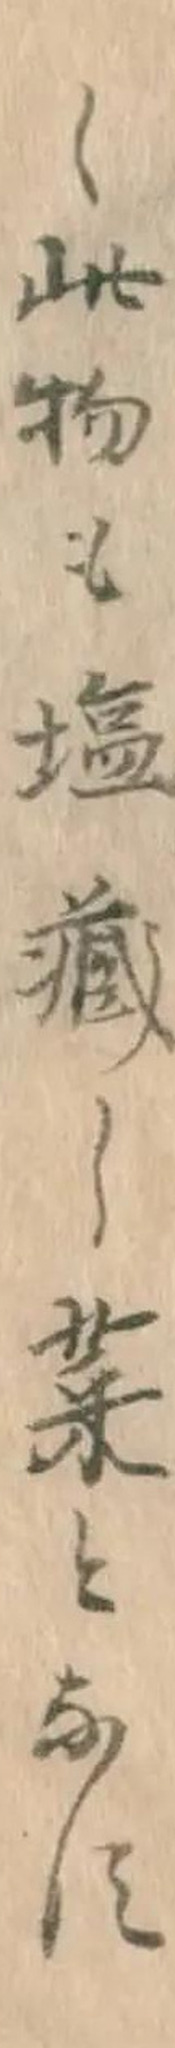此物も塩蔵し菜となす

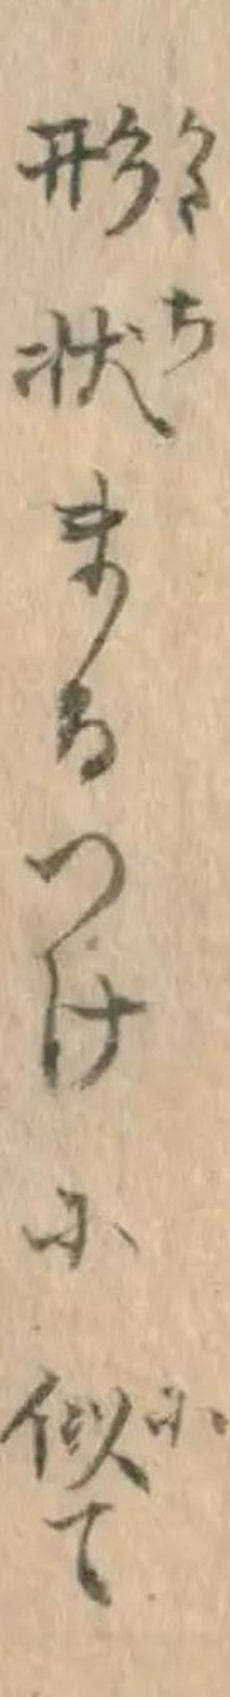形状まるつけに似て
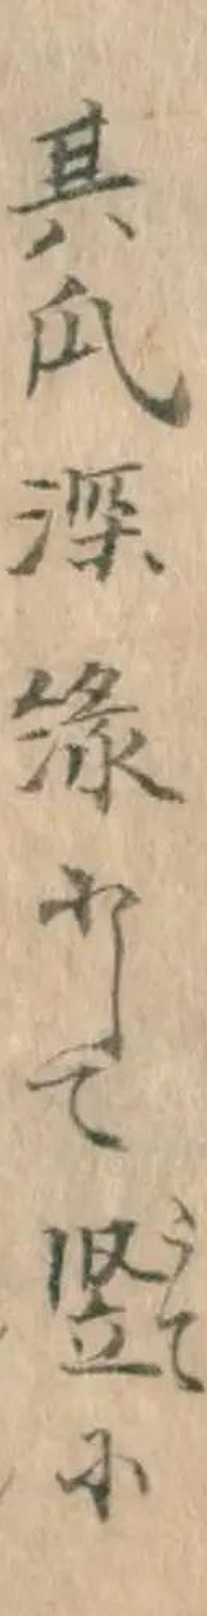其瓜深緑にして竪に
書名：本草図譜. 巻52-54
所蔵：国立国会図書館 National Diet Library, JAPAN
